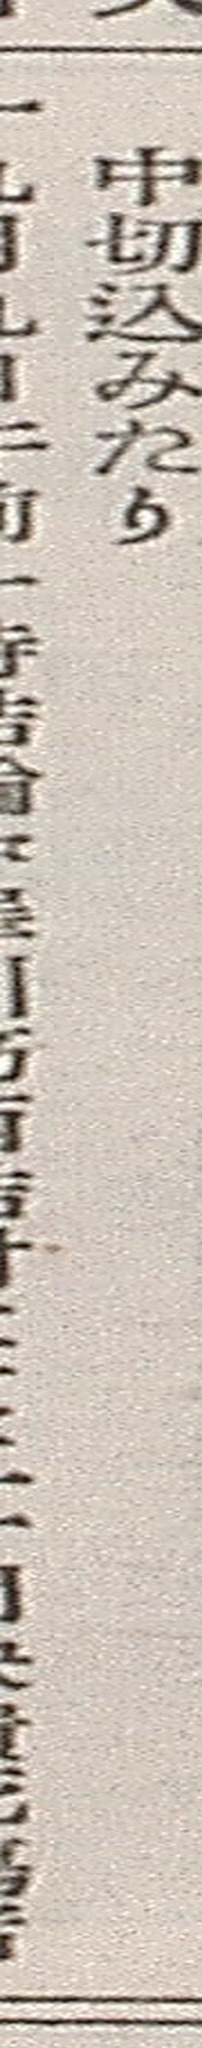一九月九日午前一時結輪中犀川筋西結村にて二十間决潰死傷者
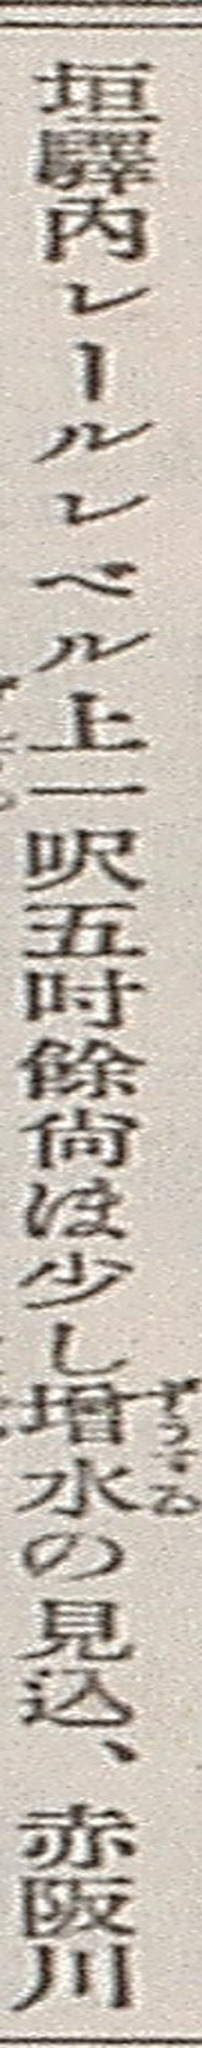垣駅内レールベル上一呎五吋餘尚ほ少し増水の見込、赤阪川
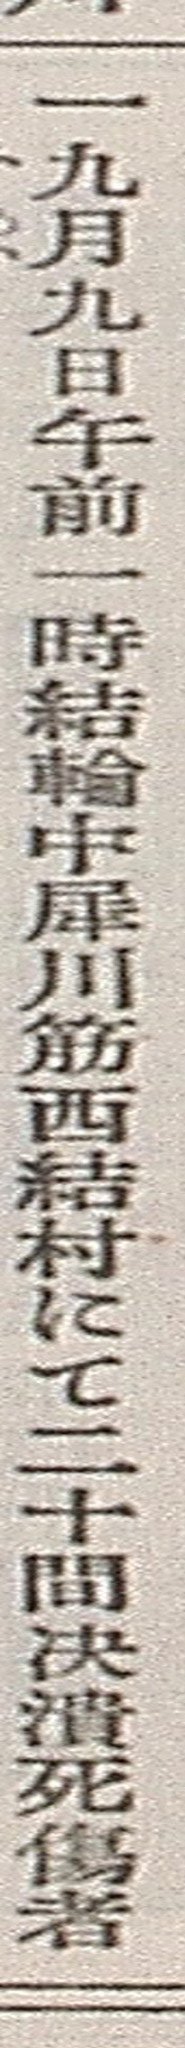一九月九日午前一時結輪中犀川筋西結村にて二十間决潰死傷者
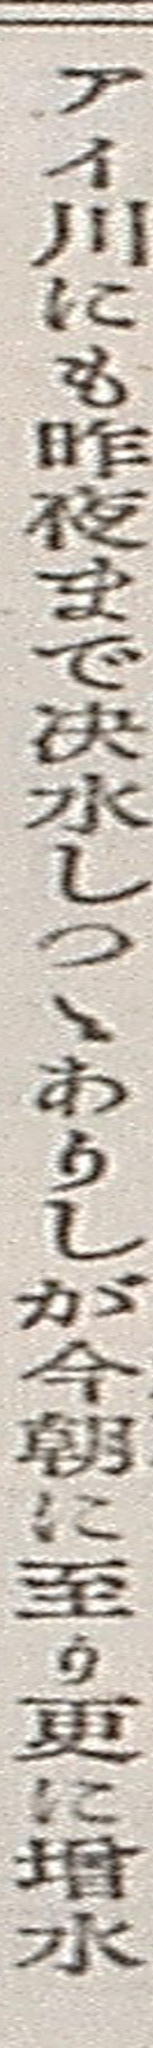アイ川にも昨夜まで决水しつゝありしが今朝に至り更に増水
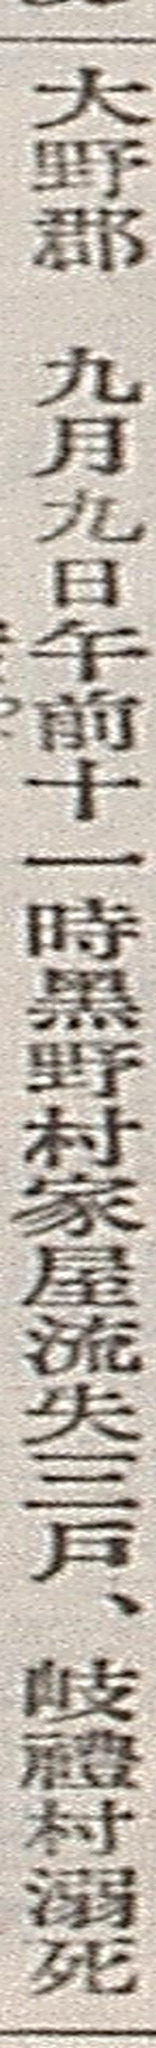大野郡九月九日午前十一時黒野村家屋流失三戸、岐禮村溺死
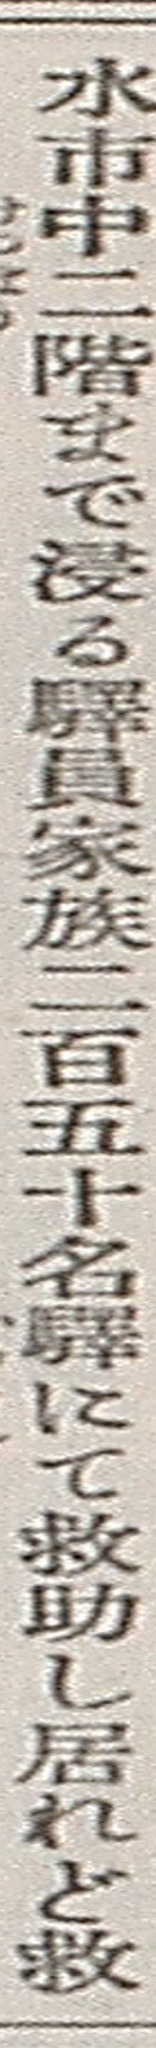水市中二階まで浸る駅員家族二百五十名駅にて救助し居れど救
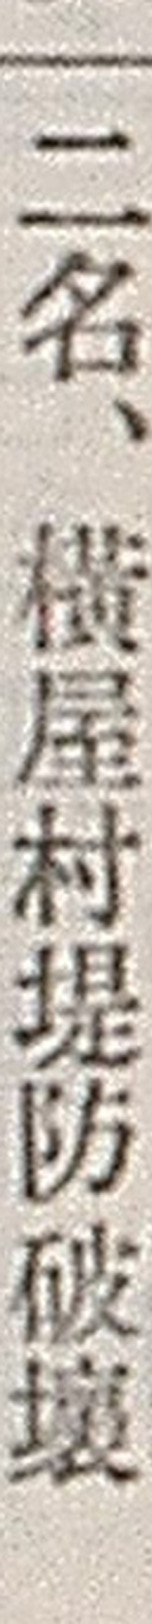二名、横屋村堤防破壊
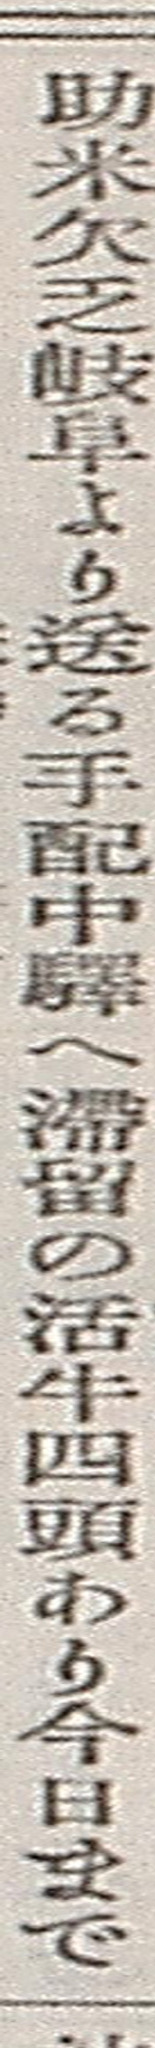助米欠乏岐阜より送る手配中駅へ滞留の活牛四頭あり今日まで
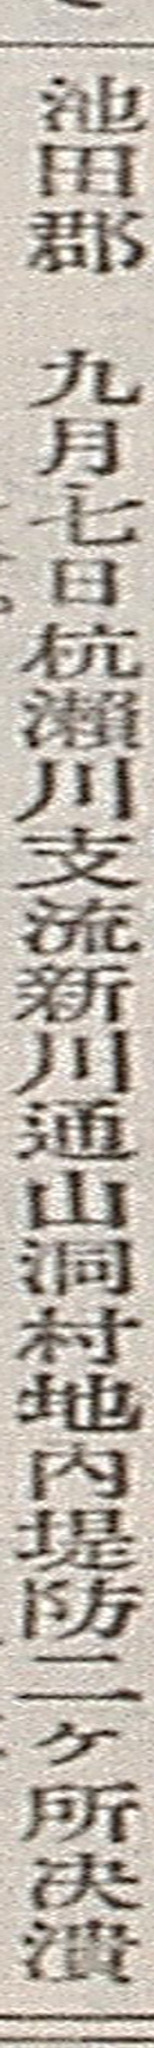池田郡九月七日杭瀬川支流新川通山洞村地内堤防二ヶ所决潰
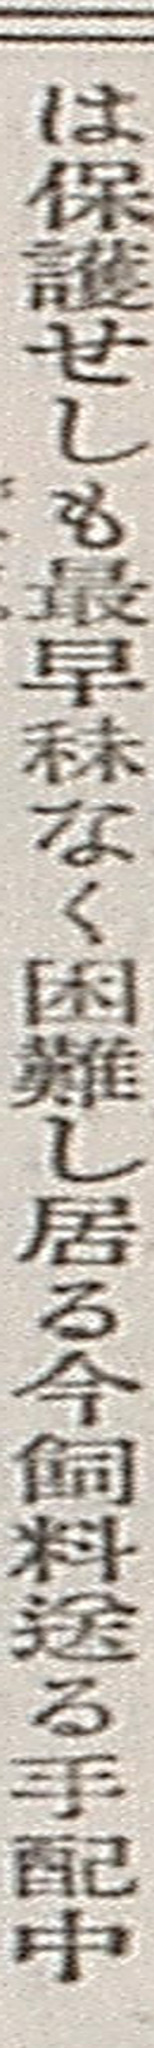は保護せしも最早秣なく困難し居る今飼料送る手配中
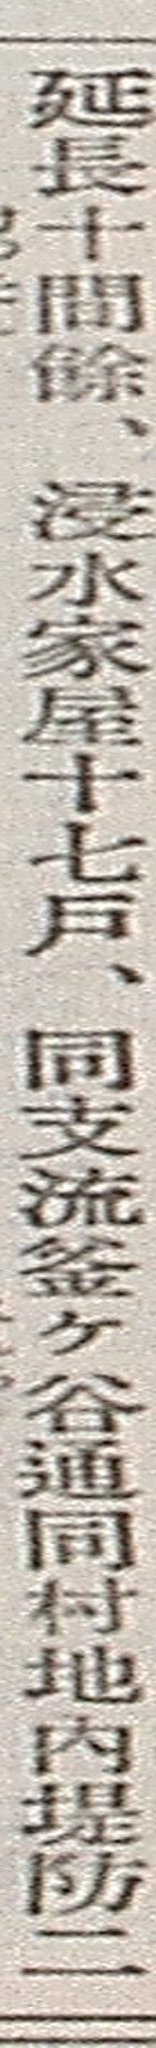延長十間餘、浸水家屋十七戸、同支流釜ケ谷通同村地内堤防二
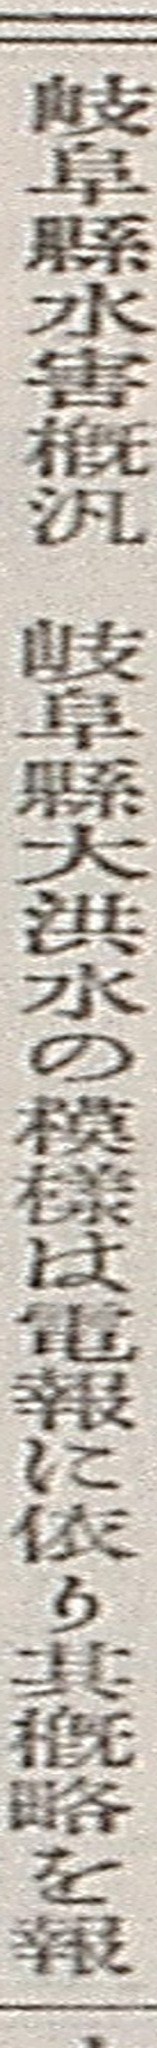岐阜県水害概況岐阜県大洪水の模様は電報に依り其概略を報
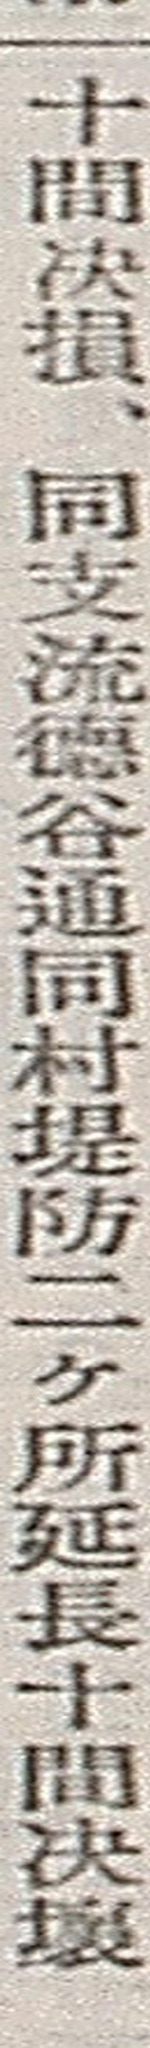十間决損、同支流徳谷通同村堤防二ヶ所延長十間决壊
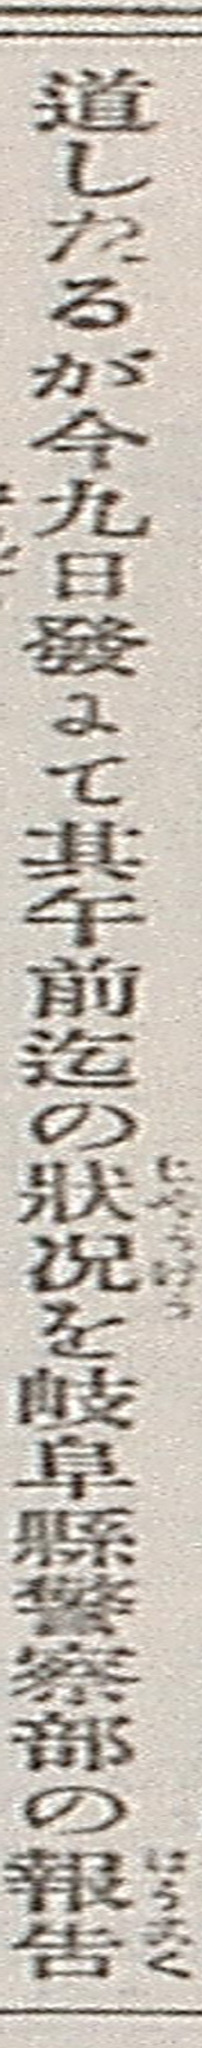道したるが今九日発にて其午前迄の状況を岐阜県警察部の報告
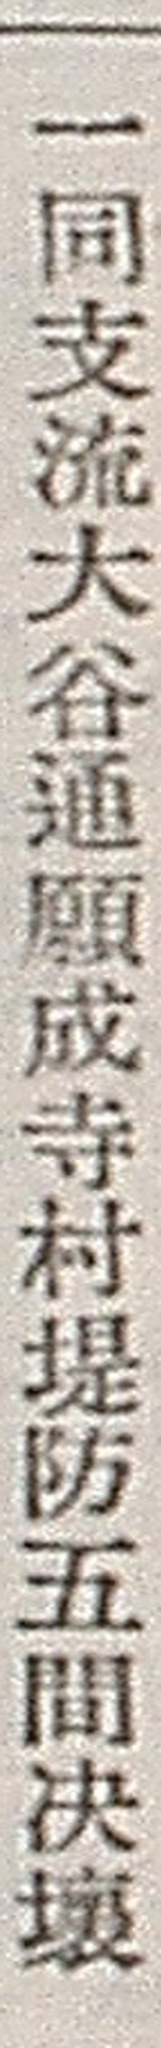一同支流大谷通願成寺村堤防五間决壊
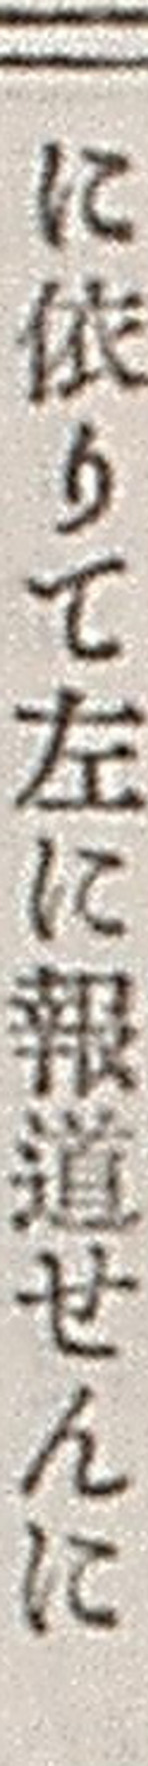に依りて左に報道せんに
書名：風俗畫報臨時増刊第百二十六號　洪水被害録（中）
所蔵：東京大学地震研究所図書室 Earthquake Research Institute Library, The University of Tokyo, JAPAN
